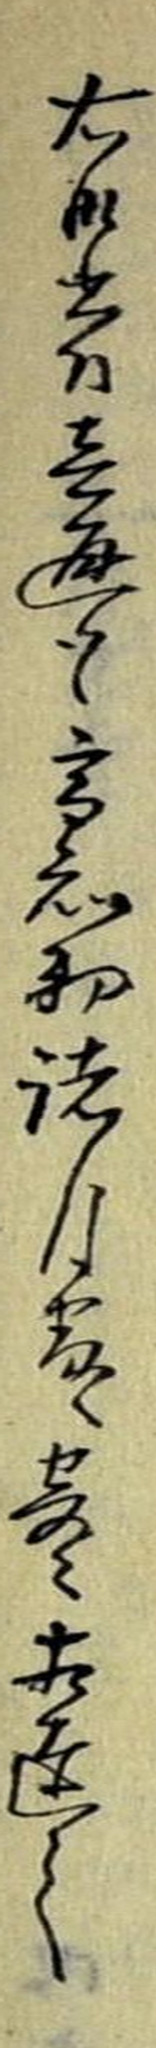右書付壱通つヽ高知初諸月番へ寄々相達之
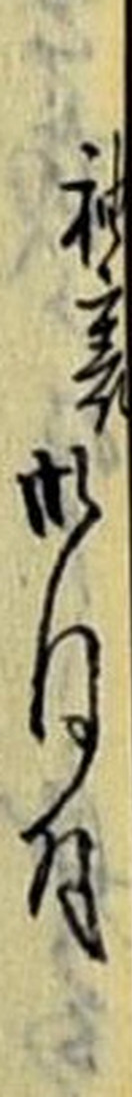御目付
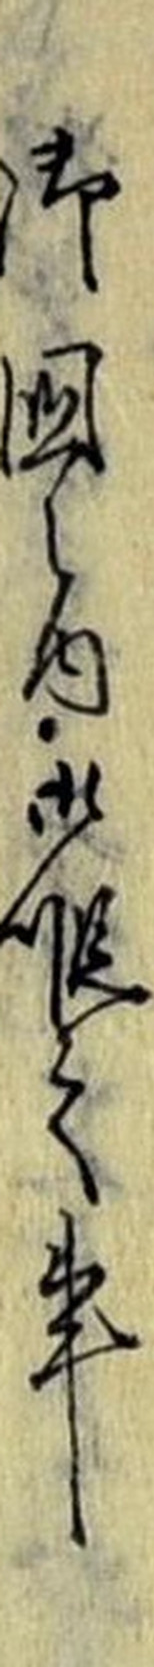御国之内御暇之事
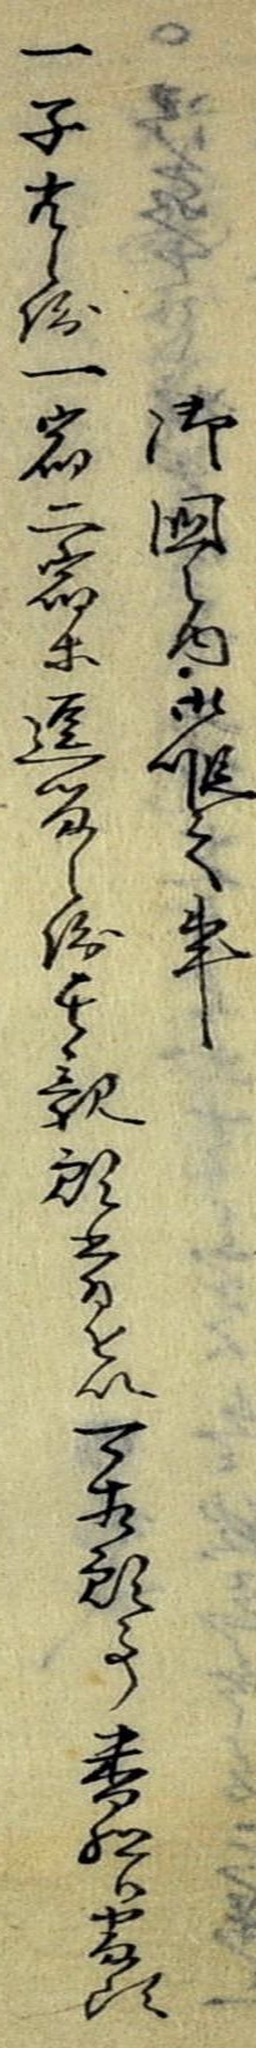一子供之儀一宿二宿等逗留之儀其親願書付を以可相願事番組は番頭
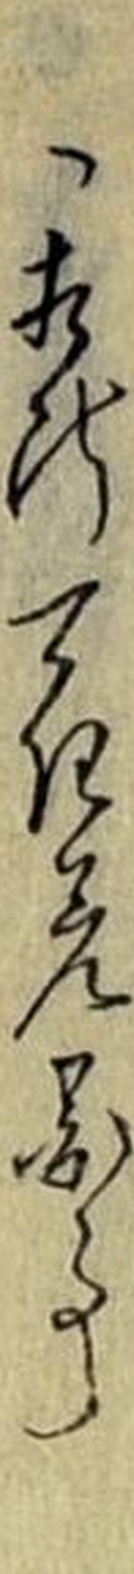へ相断可任差図事
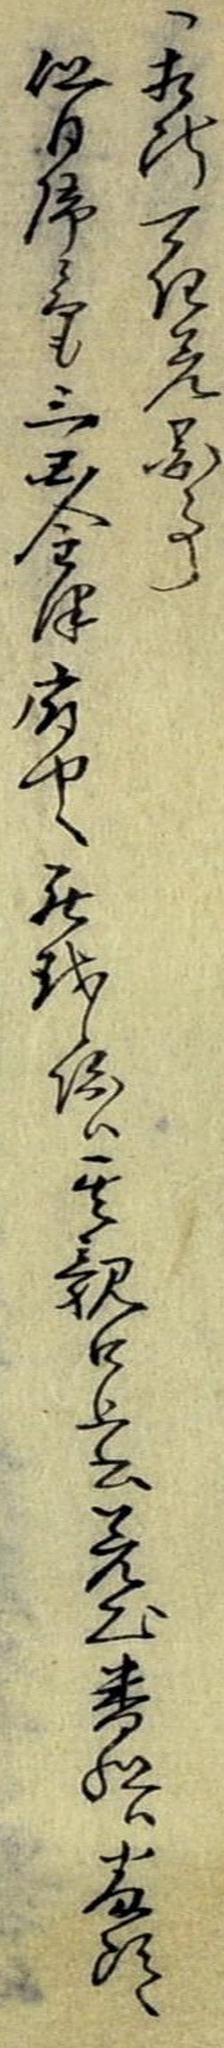但日帰に而も三国金津府中へ罷越候儀は其親口上書差出番組は番頭へ
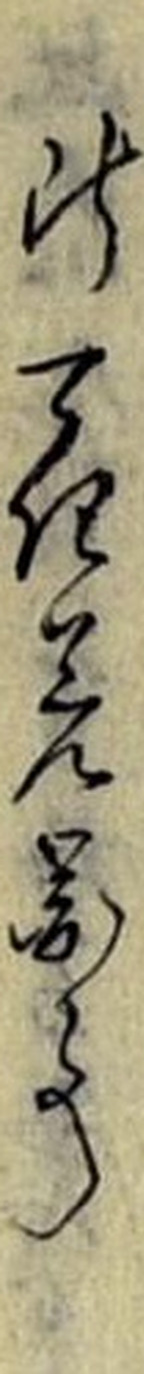断可任指図事
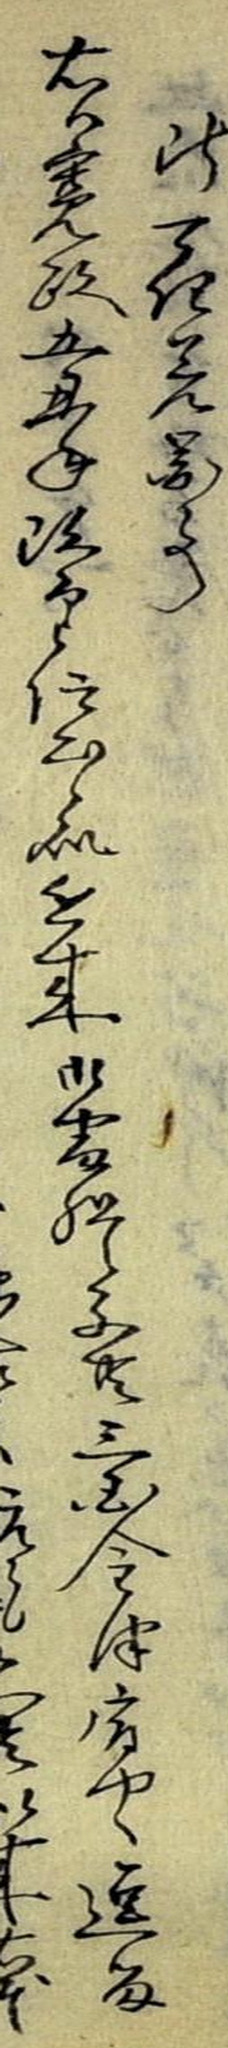右は寛政五丑年改而被仰出候処近来御番組之子供三国金津府中へ逗留
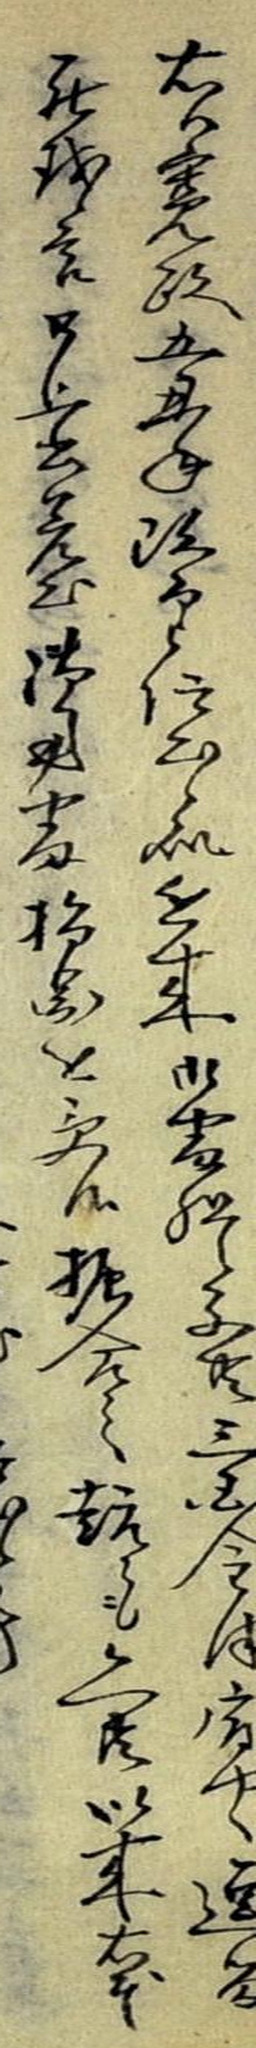罷越候節口上書差出御用番指図を受候振合之趣にも候へ共以来右本
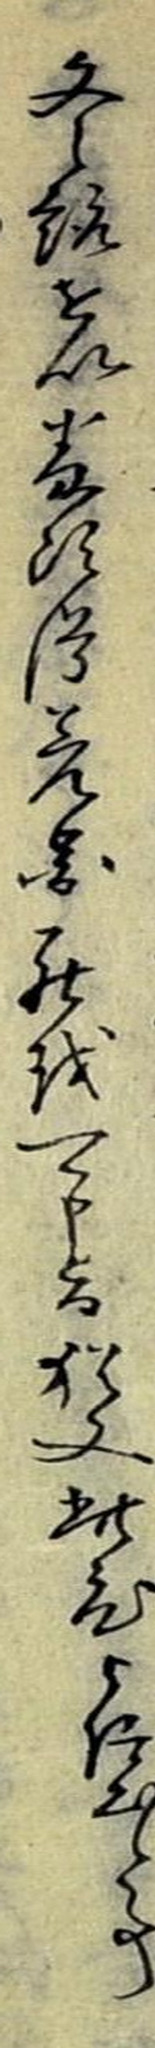文之趣を以番頭得差図罷越可申旨猶又此度被仰出候事
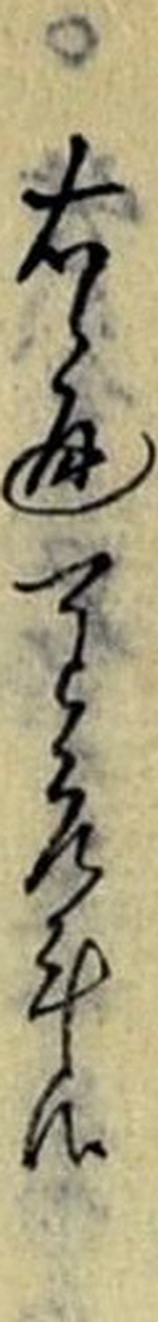右之通可被申通候
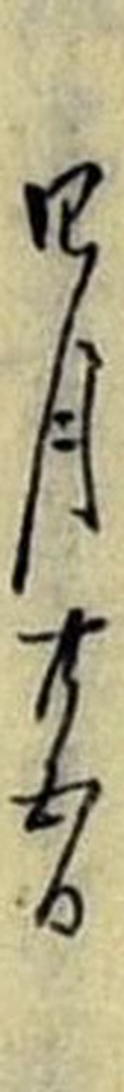四月廿五日
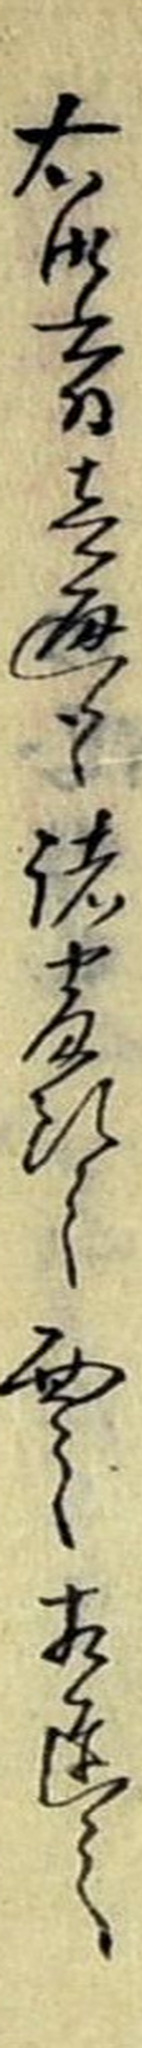右御書付壱通つヽ諸番頭之面々相達之
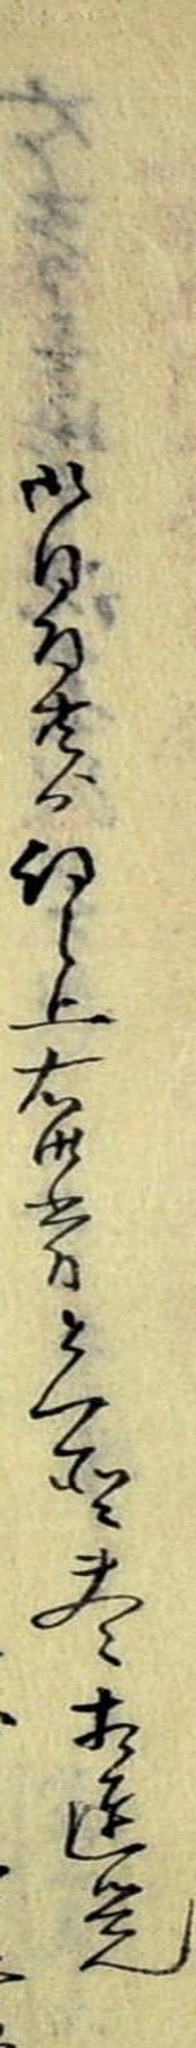御目付共ゟ伺之上右御書付と一所に夫々相達覚
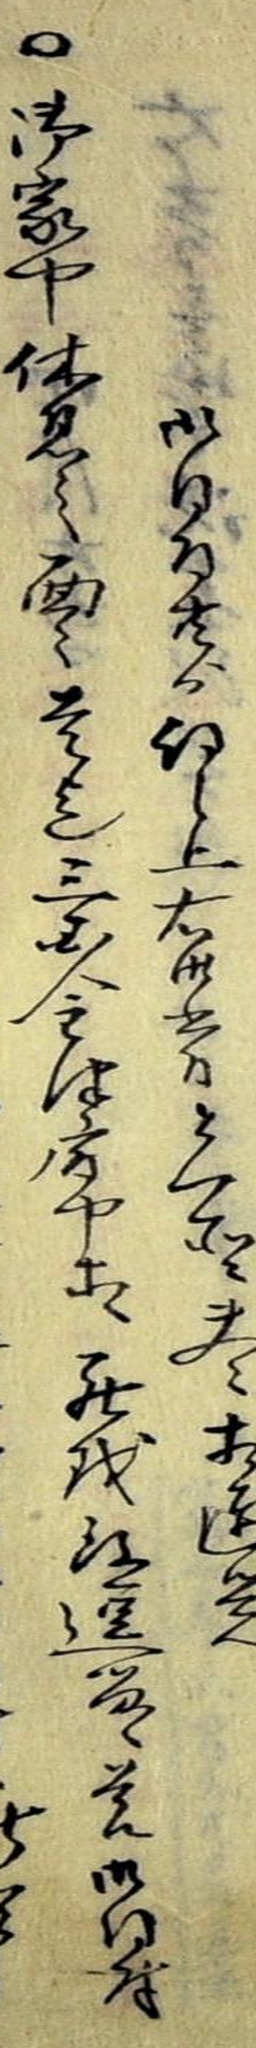○御家中休息之面々是迄三国金津府中等へ罷越致逗留候節御目付
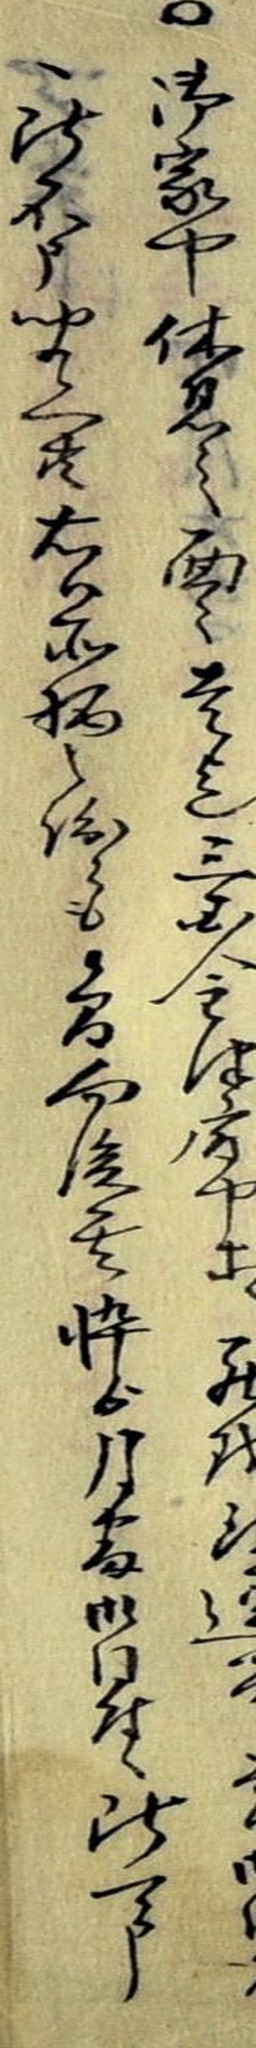へ断不申聞候へ共右は所柄之儀にも候間向後其忰ゟ月番御目付へ断可申
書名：命令之部 六
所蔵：福井県文書館 Fukui Prefectural Archives
